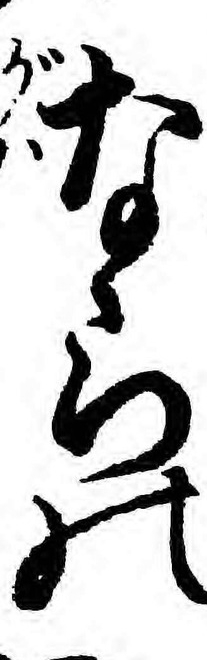ならの
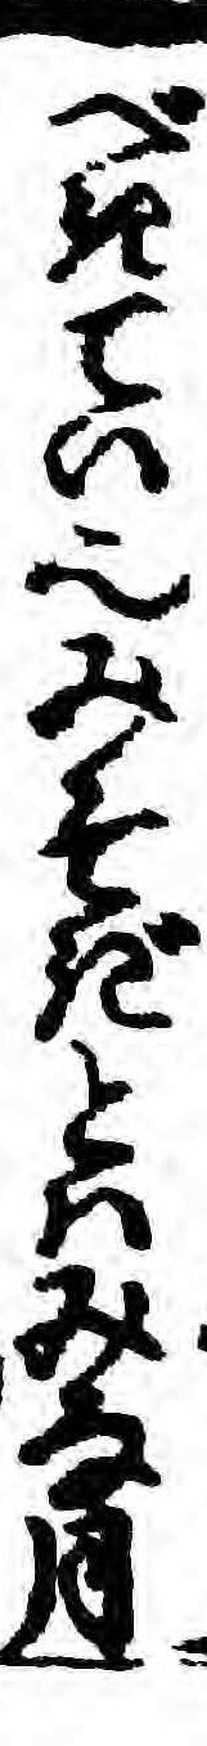べきてい也みそぎとはみな月
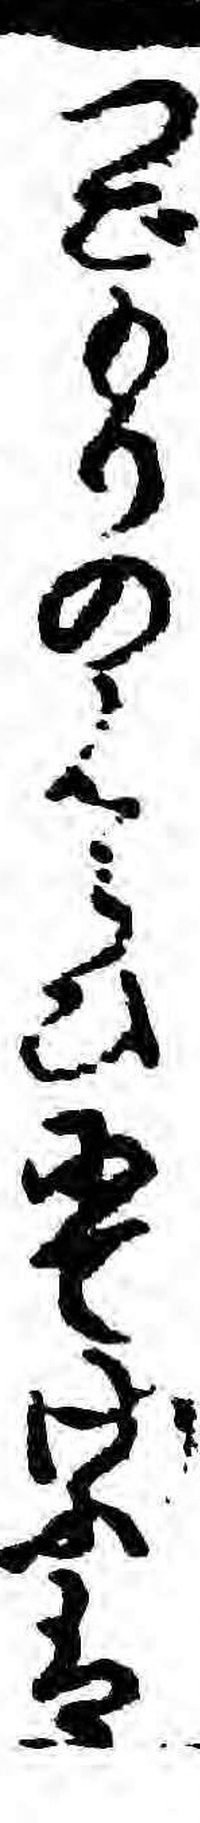つごもりのはらひにてけふは
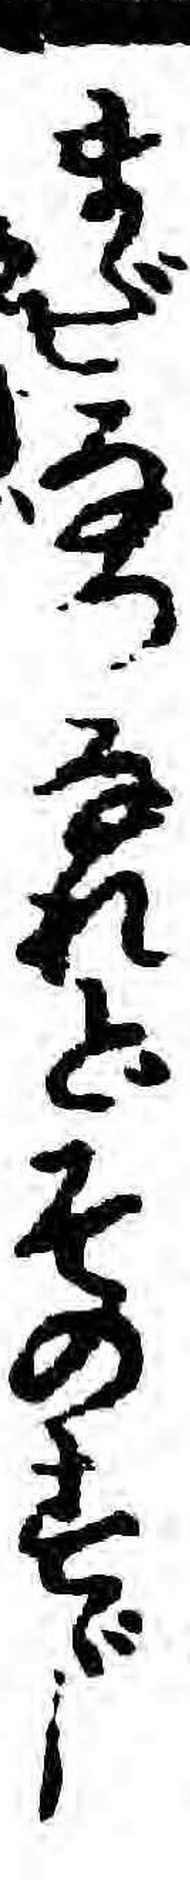まだなつなれどそのすゞし
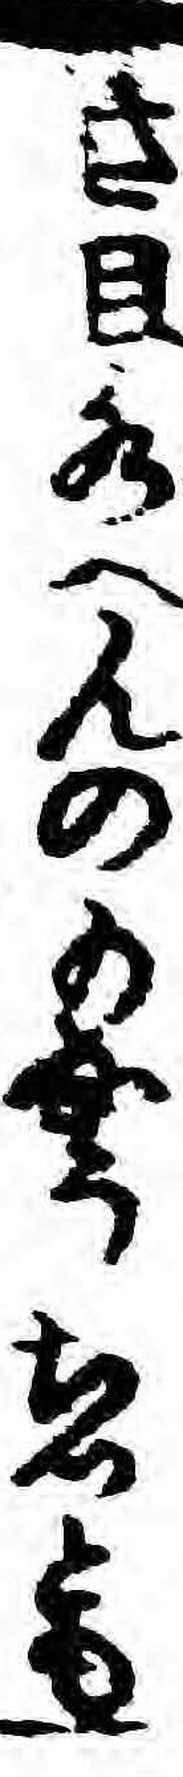さ目水へんのもやうちつとも
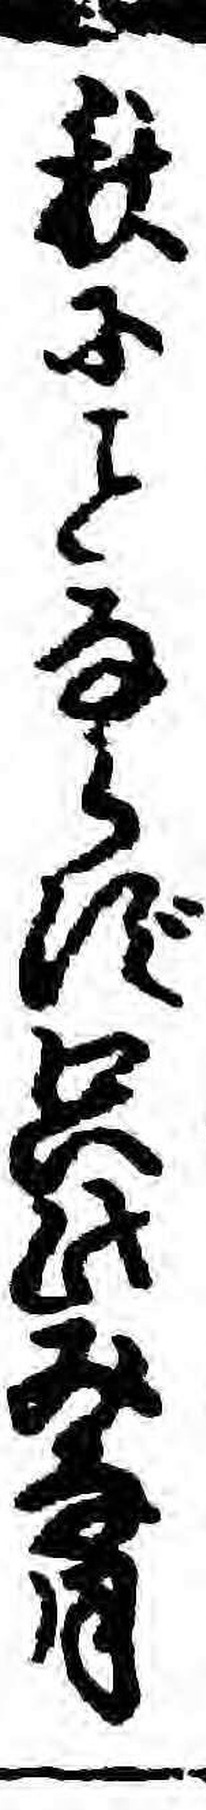秋にことならず只此みな月
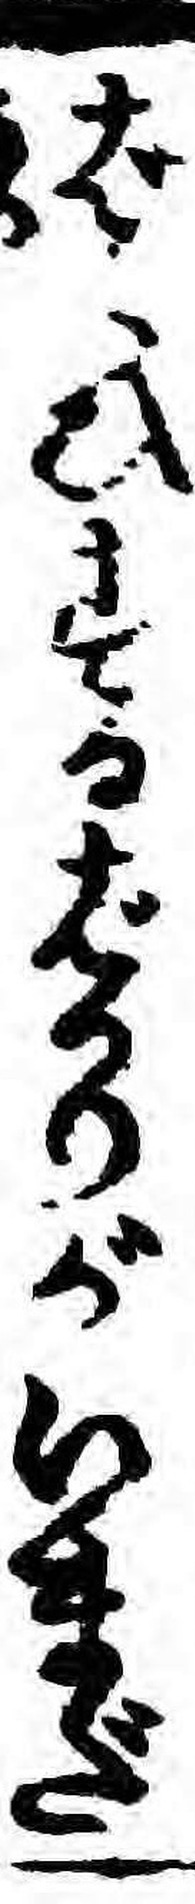ばらひするばかりがいまだ
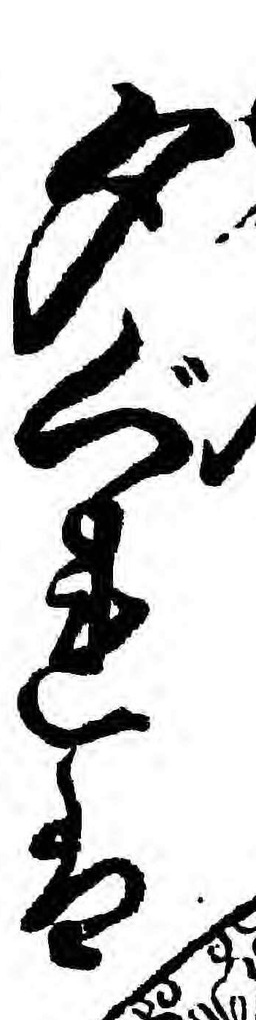夕ぐれは
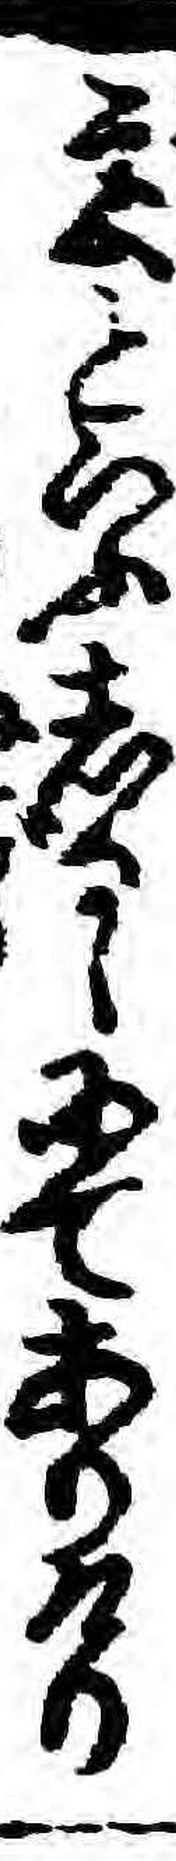夏といふしるしにてありけり
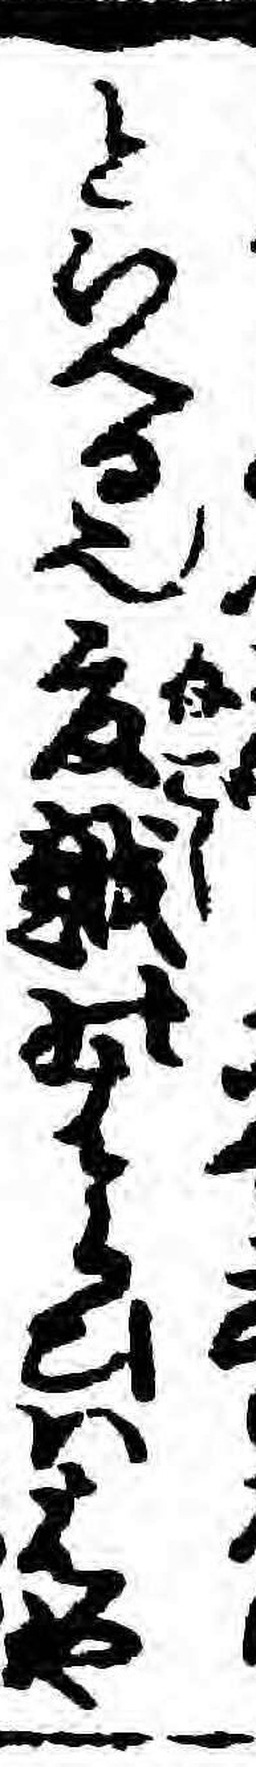といへる也夏越のはらひははや
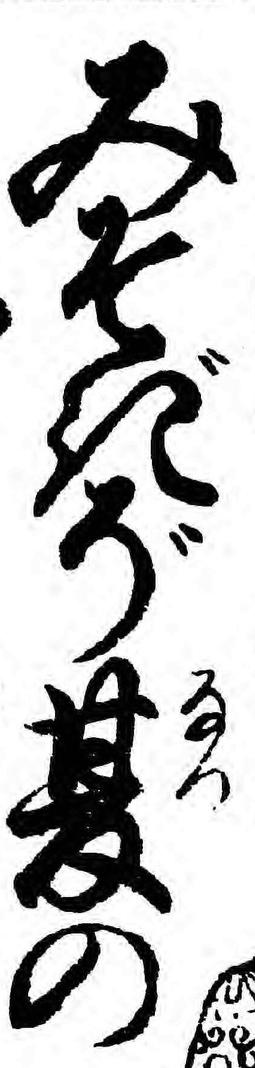みそぎぞ夏の
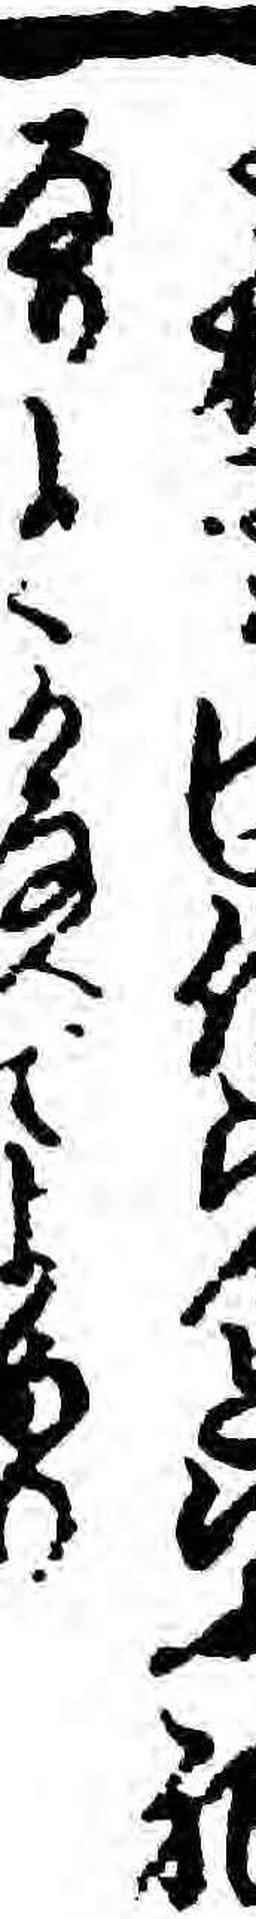なりよくかなへてよめり
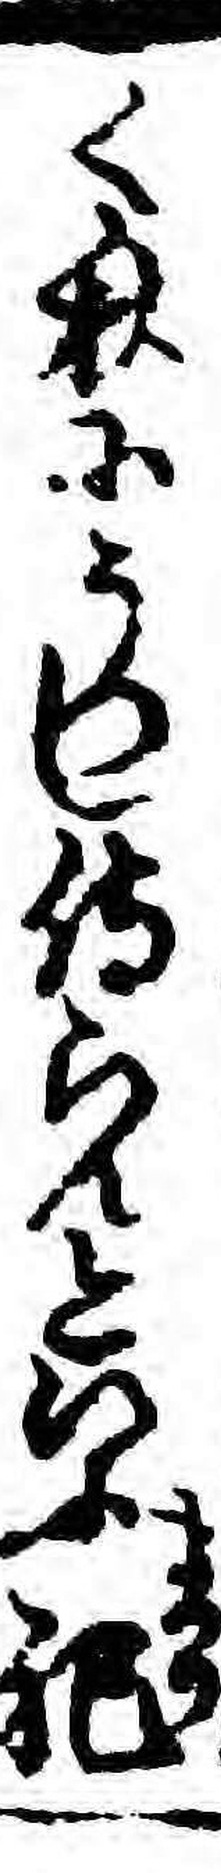く秋にうつし侍らんといふ祀
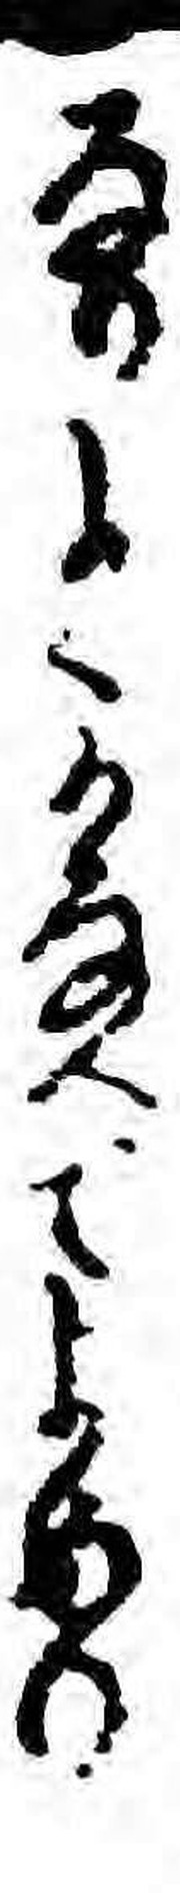なりよくかなへてよめり
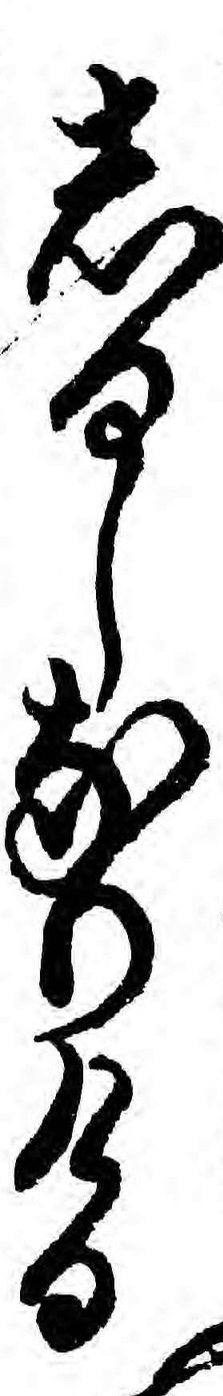しるしなりける
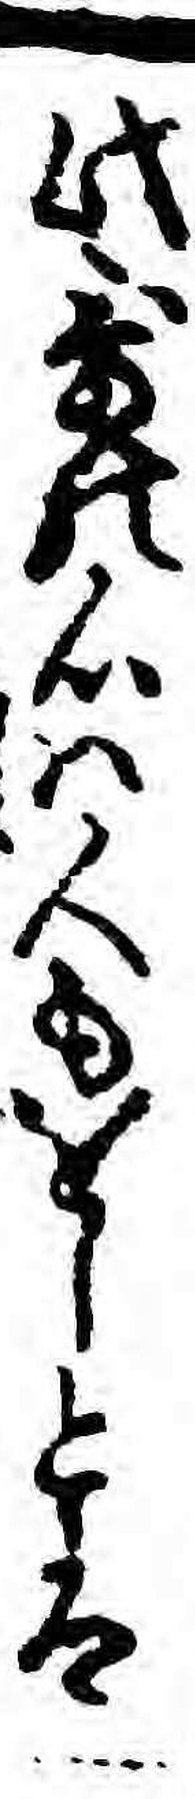此歌の心は人もをしとは
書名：頭書和歌注譯／壽賀多百人一首小倉錦
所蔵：国文学研究資料館
